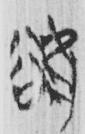欲
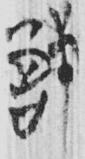訐（諫）
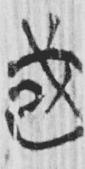或（又）
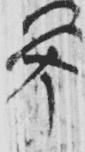不
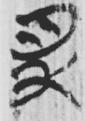○（得）
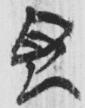見
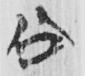公
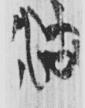沽
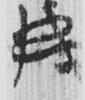弗
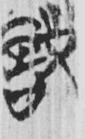○（察）
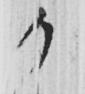人
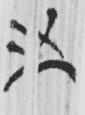之
